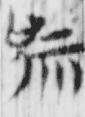祝
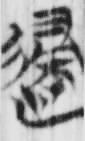歸
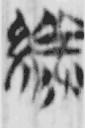○（佩）
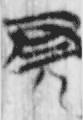○（冠）
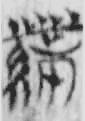○（帶）
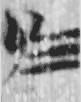於
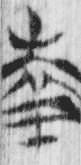南
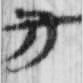方
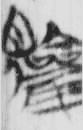觀
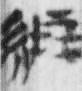綳
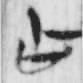占
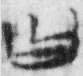曰
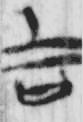吉
